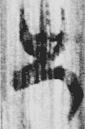也
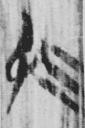於
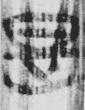是
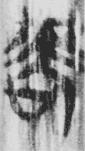唬（乎）
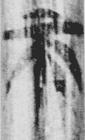天
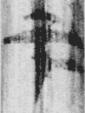下
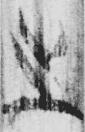之
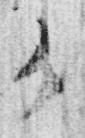人
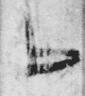㠯（以）
